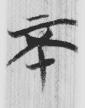不
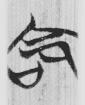命
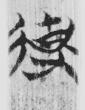𫹒
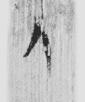人
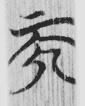而
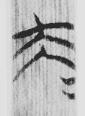夫=
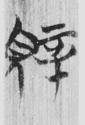親
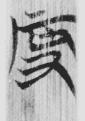辱
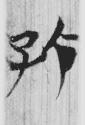孤
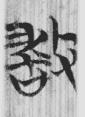敢
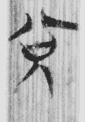兌
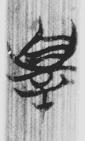辠
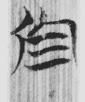於
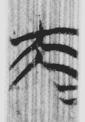夫=
